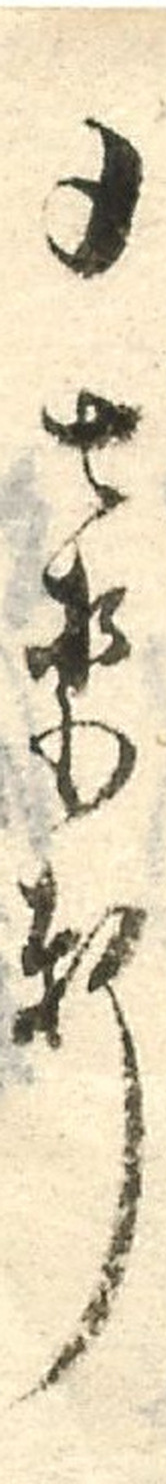〆七十五軒
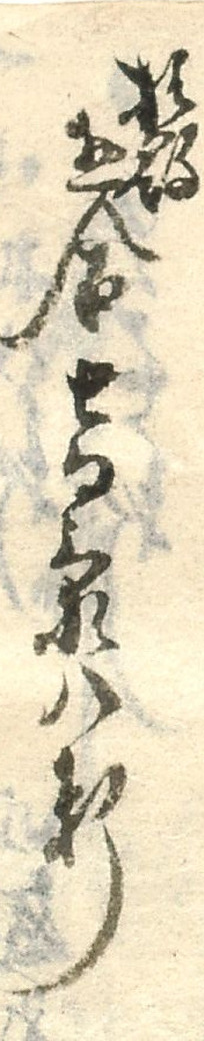惣合七百三十八軒
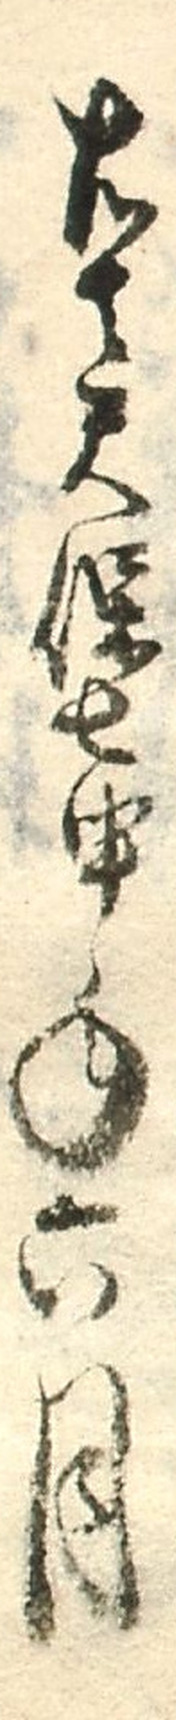右は天保七申年六月
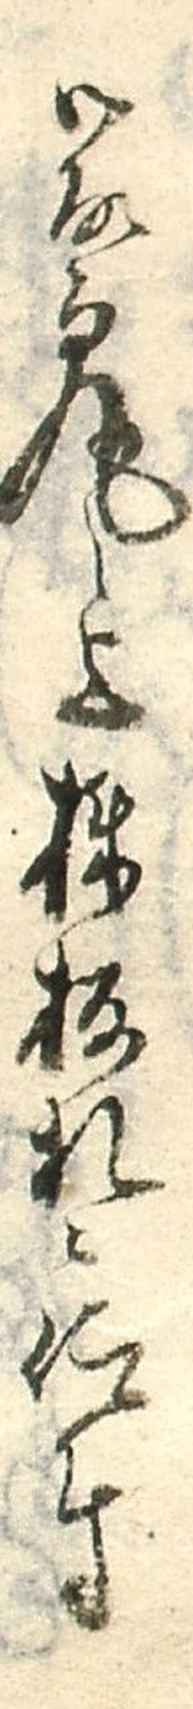御取究之上株板札被仰付
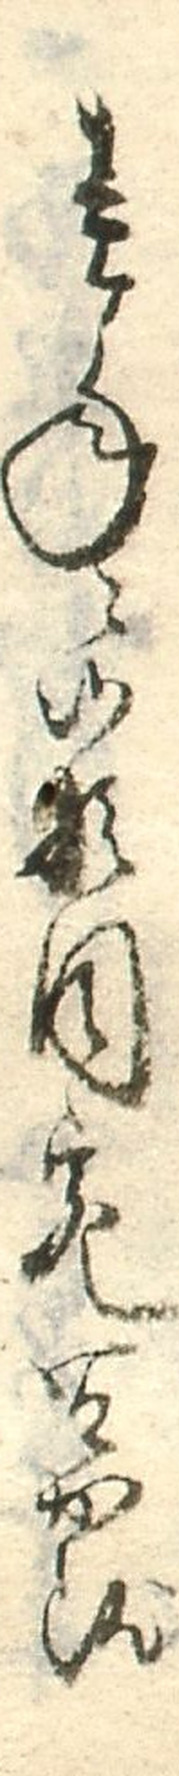一ヶ年に二十目宛冥加銀
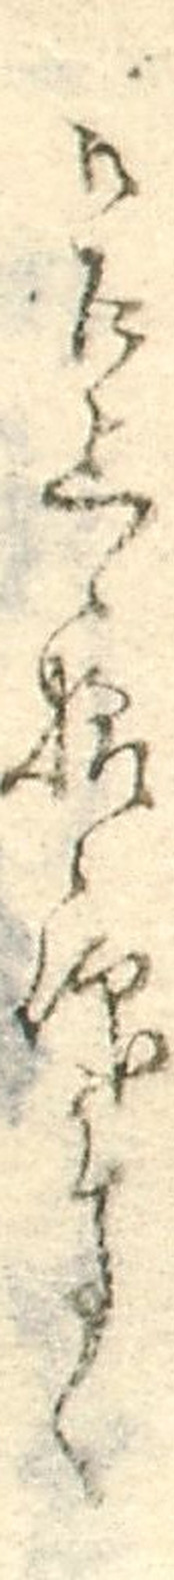被召上候様被仰付候
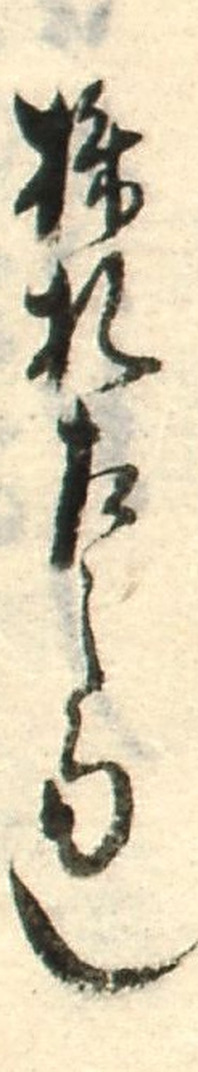株札左之通
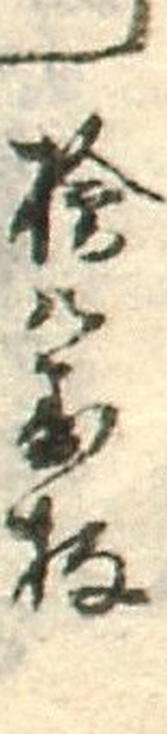檜八番板
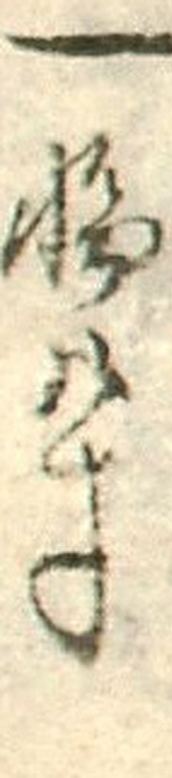幅八寸
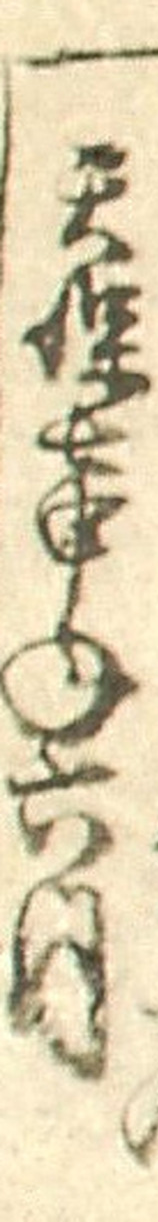天保七申年六月」
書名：郷酒株絞油株質屋株御取窮郡中名面帳並諸郡株数相改帳
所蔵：鳴門教育大学 Naruto University of Education
